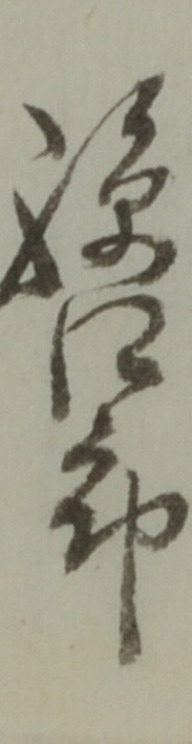孫四郎
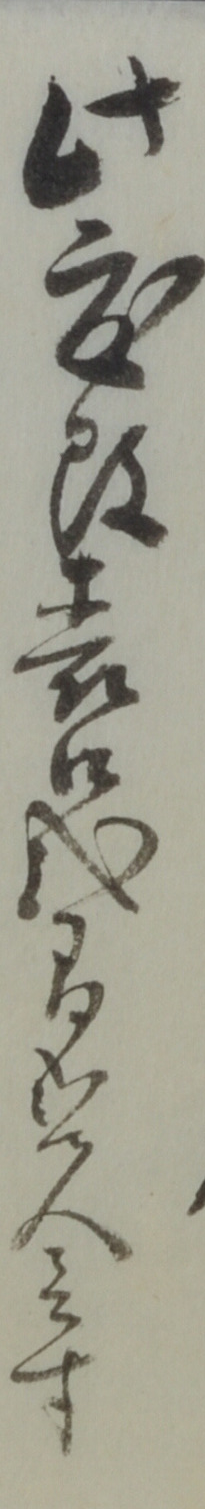此度改表口弐間弐尺壱寸
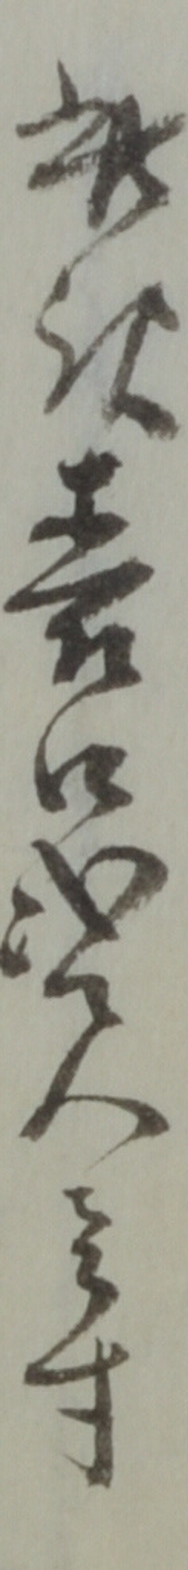此訳表口弐尺壱寸
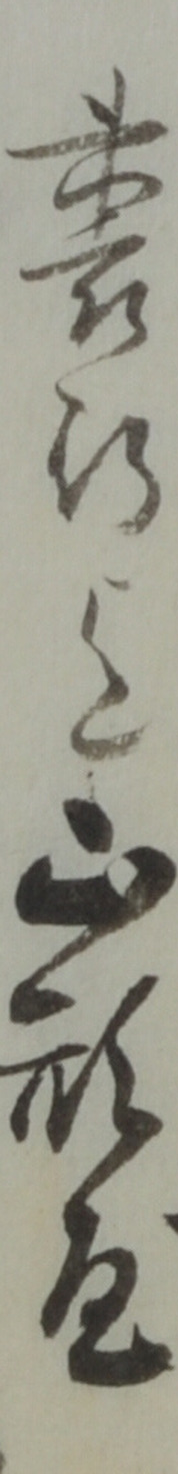裏行迄山形屋
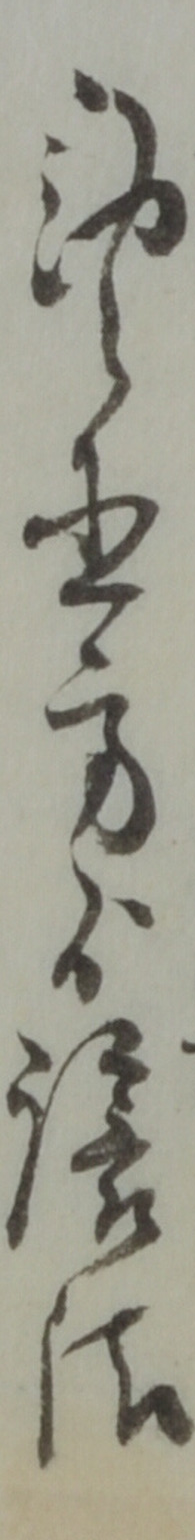勘之丞方ゟ譲請

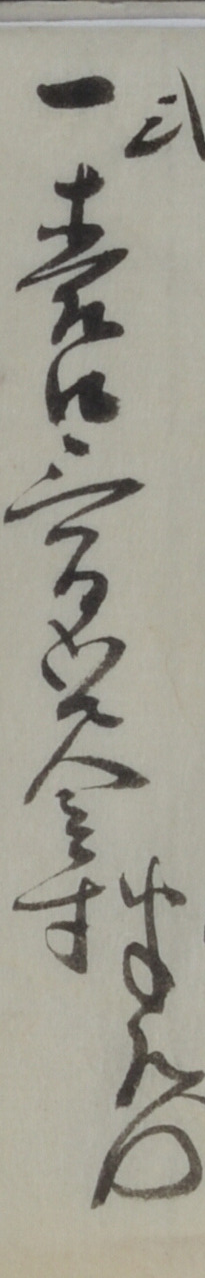一表口三間弐尺一寸半左衛門
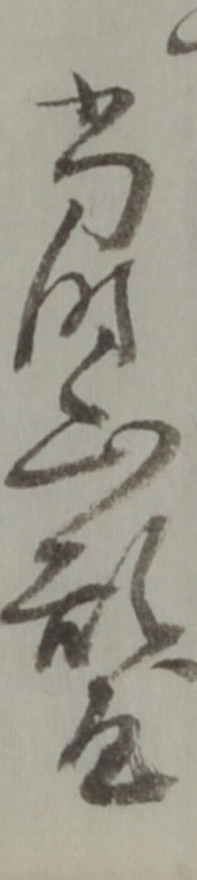当時山形屋
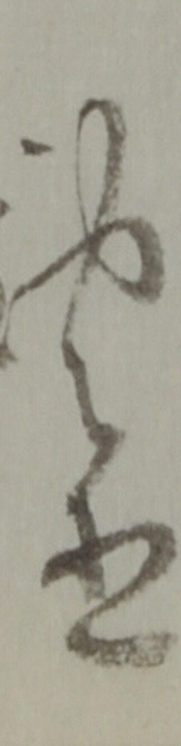勘之丞
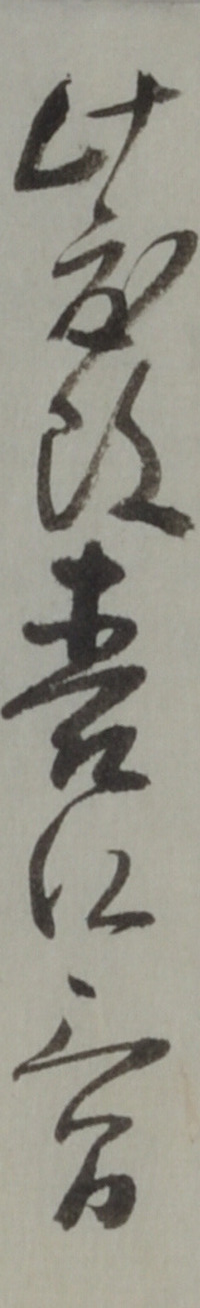此度改表口三間
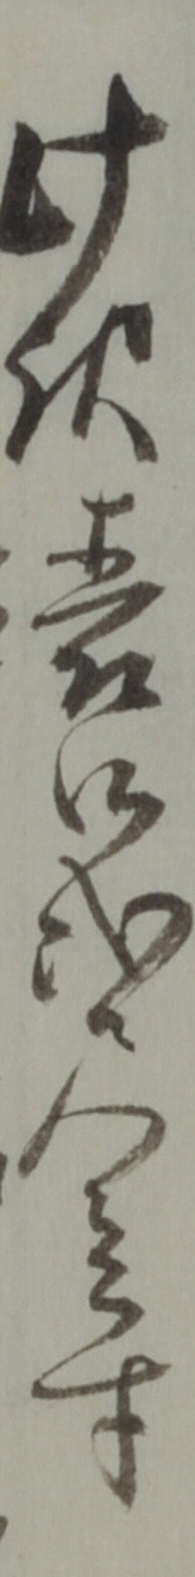此訳表口弐尺壱寸
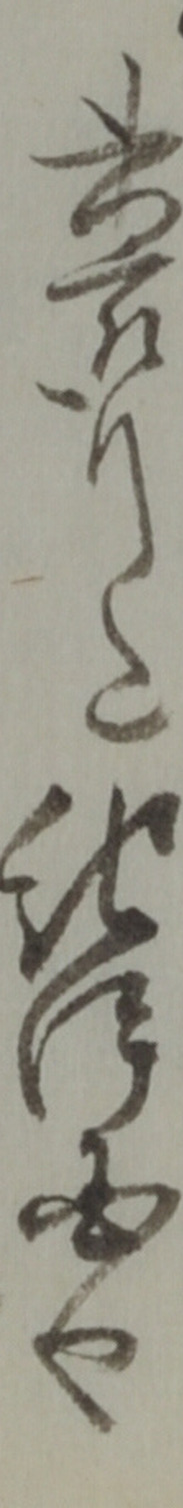裏行迄紀伊国や
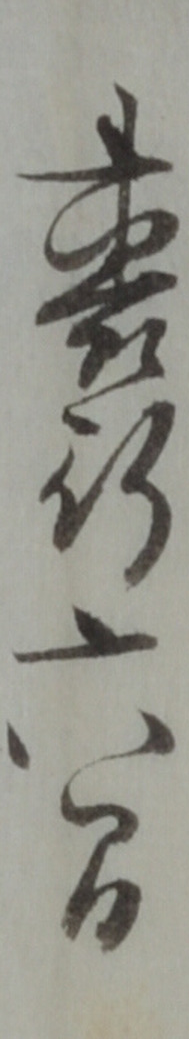裏行六間
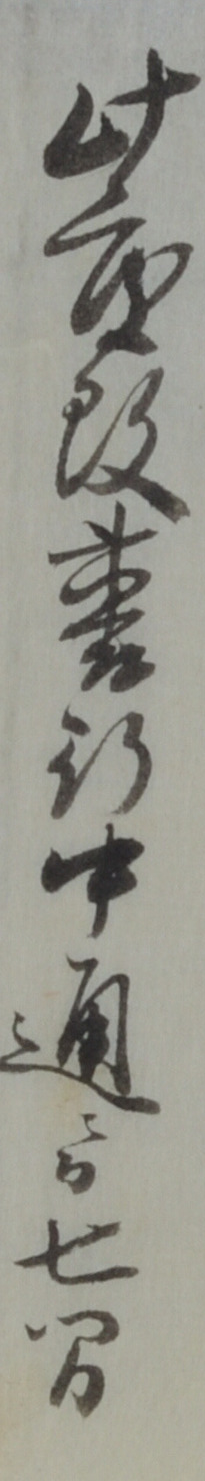此度改裏行中通ニ而七間
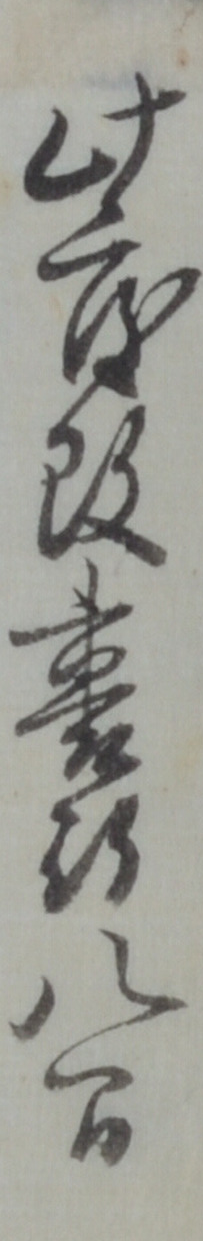此度改裏行八間
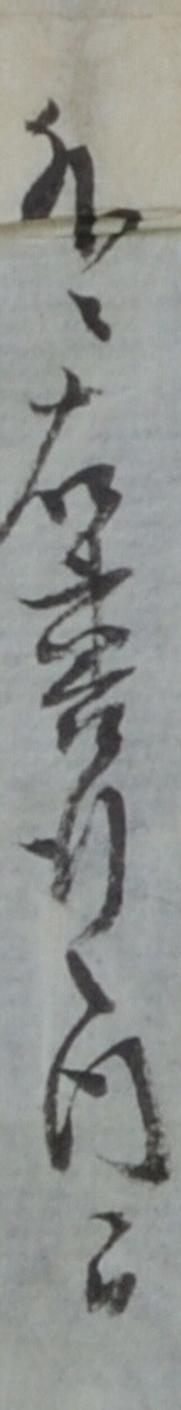外ニ右裏行之内ニ而

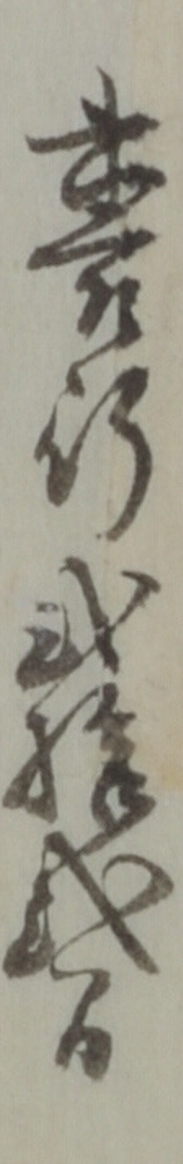裏行三拾間
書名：屋敷表口裏行書上
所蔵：伊那市立高遠町図書館・合同会社AMANE
